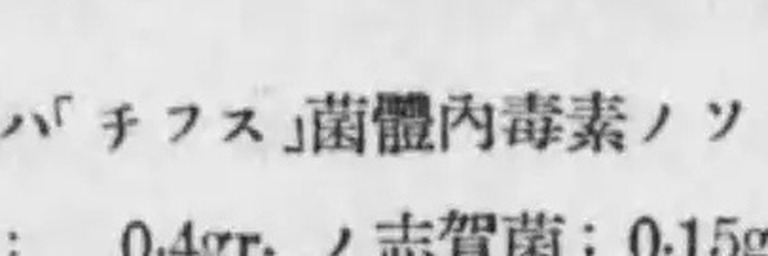「チフス」菌体内毒素
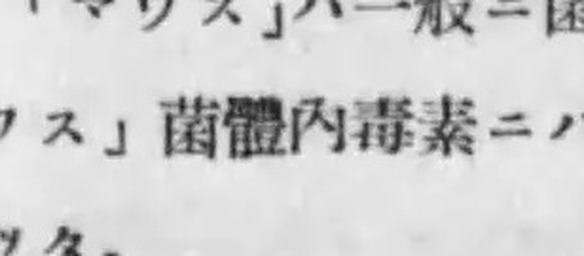「チフス」菌体内毒素
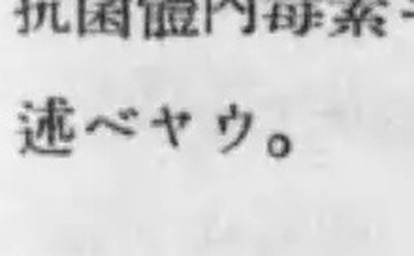述べやう。
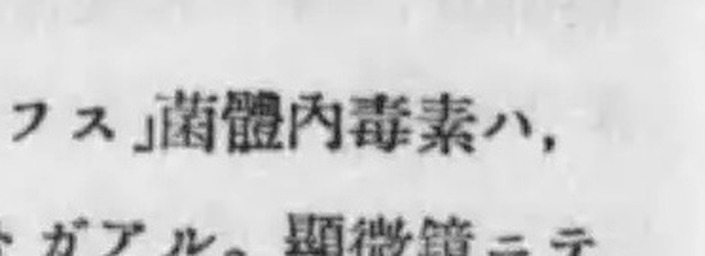「チフス」菌体内毒素

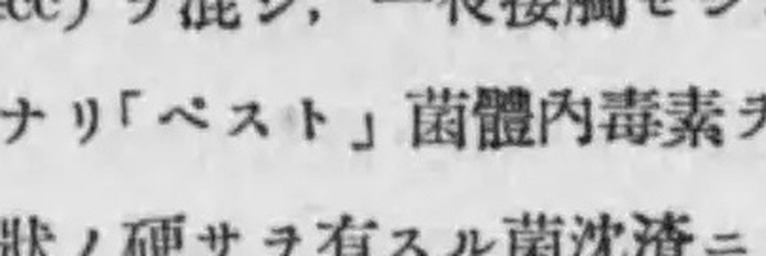「ペスト」菌体内毒素
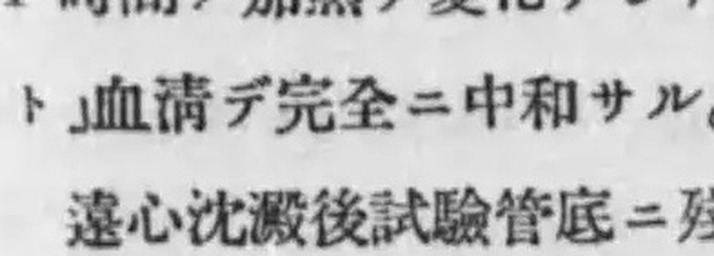ト」血清で完全に中和さる。
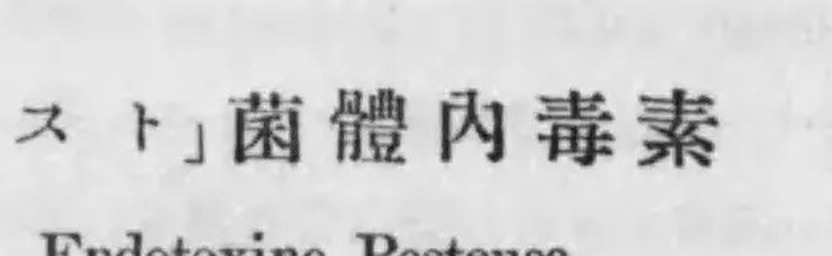「ペスト」菌体内毒素
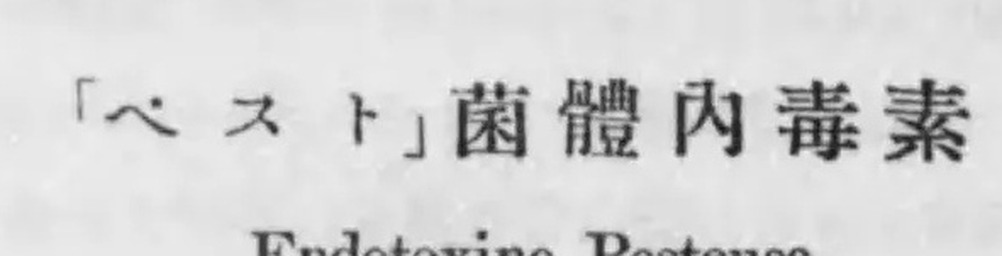「ペスト」菌体内毒素
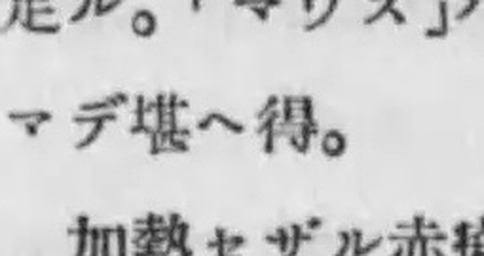まで堪へ得。

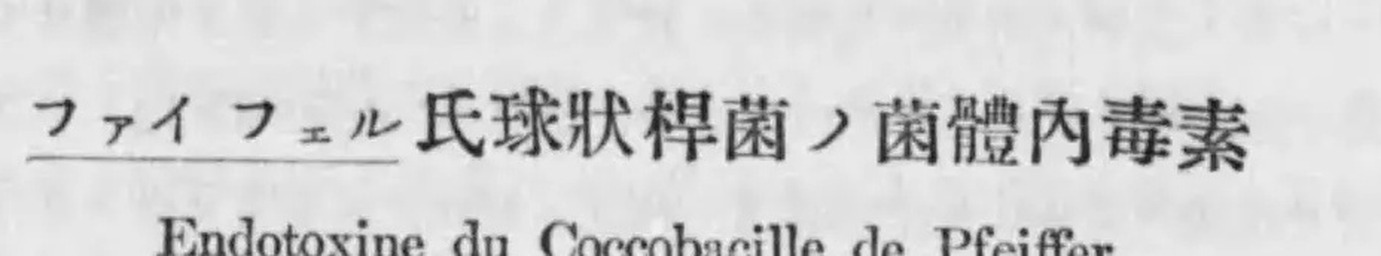ファイフェル氏球状桿菌の菌体内毒素
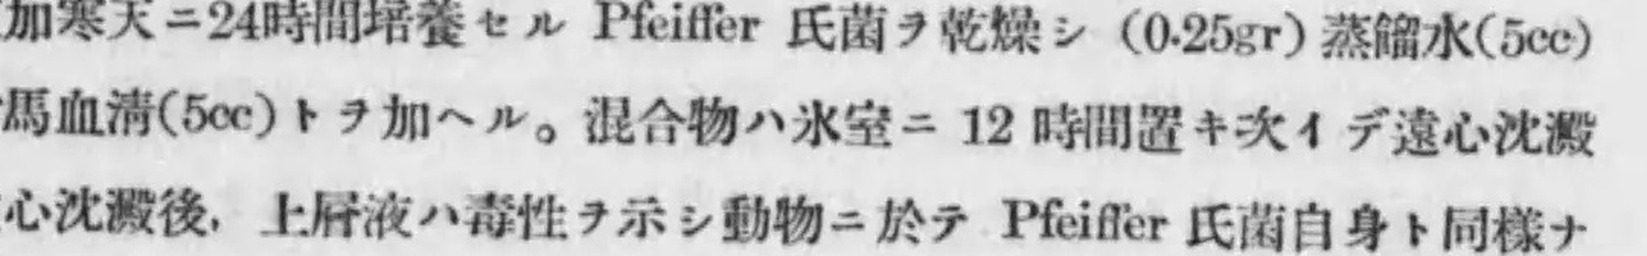と正常馬血清()とを加へる。混合物は氷室に時間置き次いで遠心沈澱
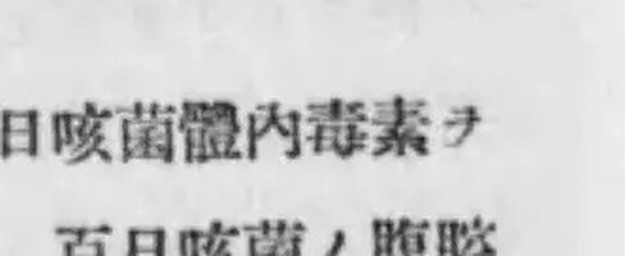百日咳菌体内毒素

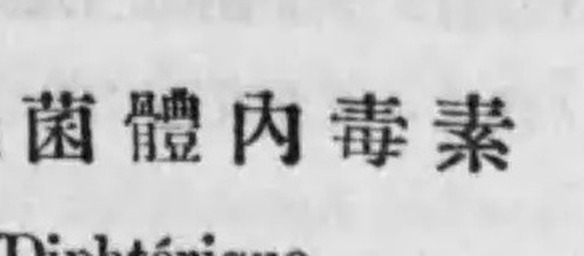の菌体内毒素
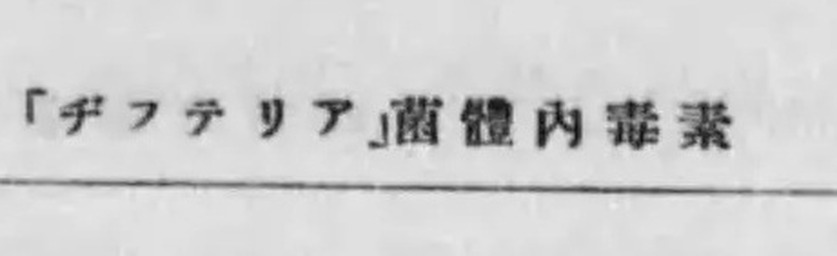「ヂフテリア」菌体内毒素
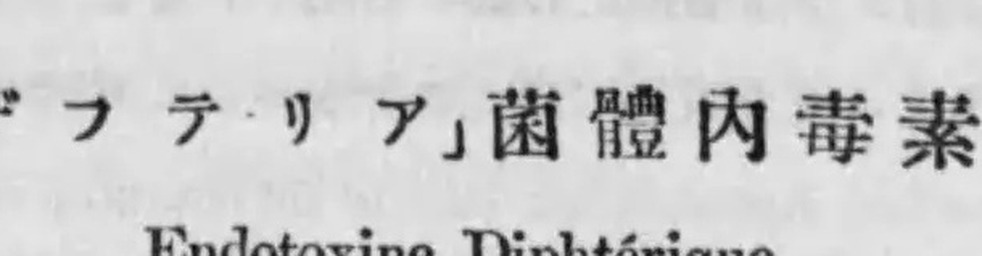「ヂフテリア」菌体内毒素
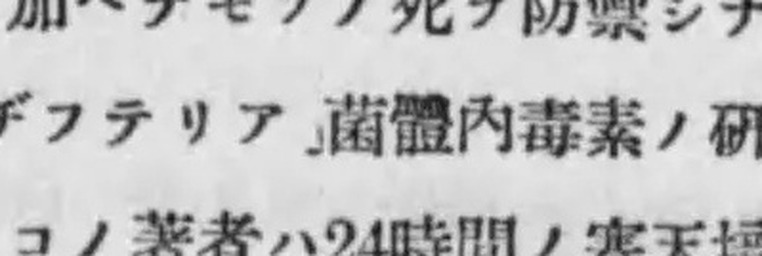「ヂフテリア」菌体内毒素
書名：伝染病ニ於ケル免疫ニ関スル研究
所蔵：国立国会図書館 National Diet Library, JAPAN
